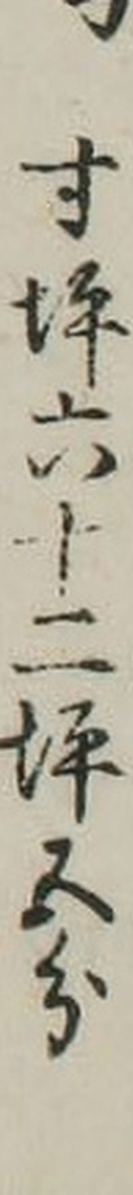寸坪六十二坪五分
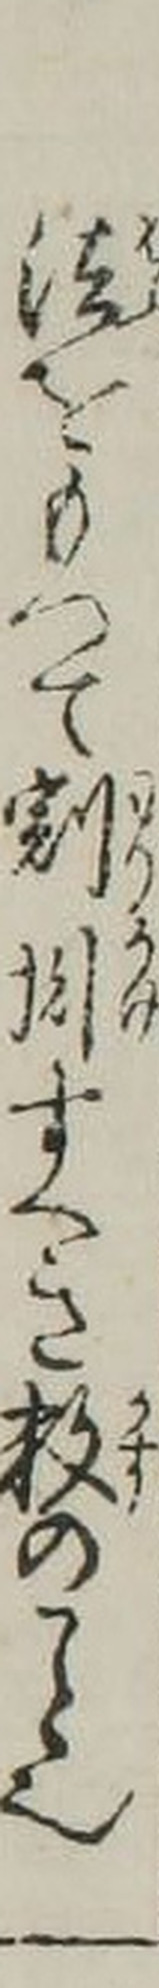実法をもつて割掛すへき数のこと也
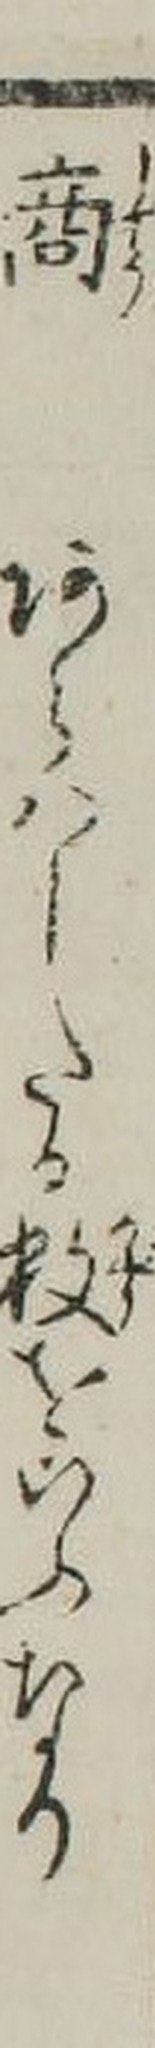商あらはしたる数をいふなり
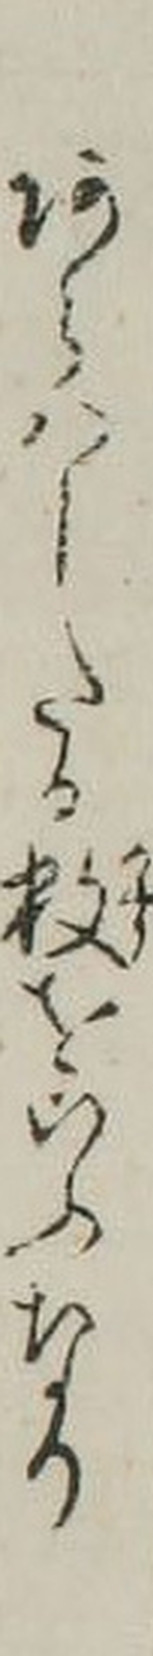商あらはしたる数をいふなり
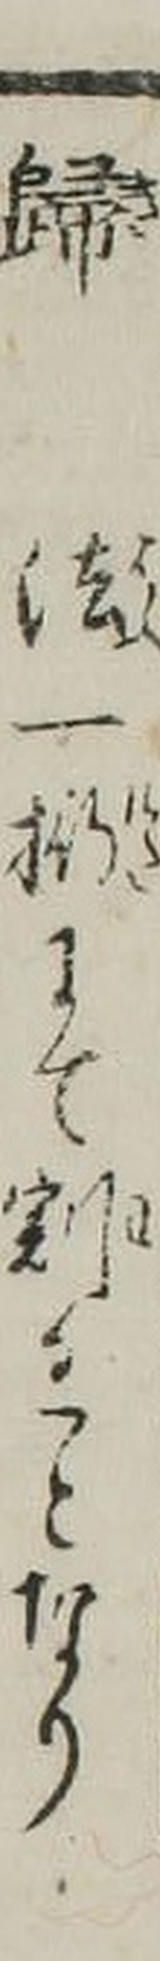帰法一桁にて割ることなり
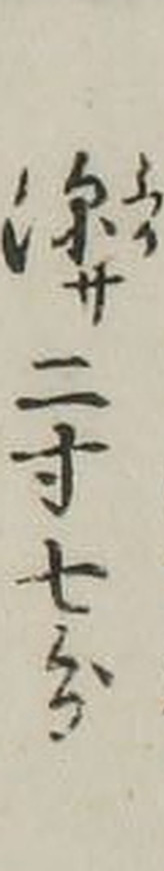深二寸七分
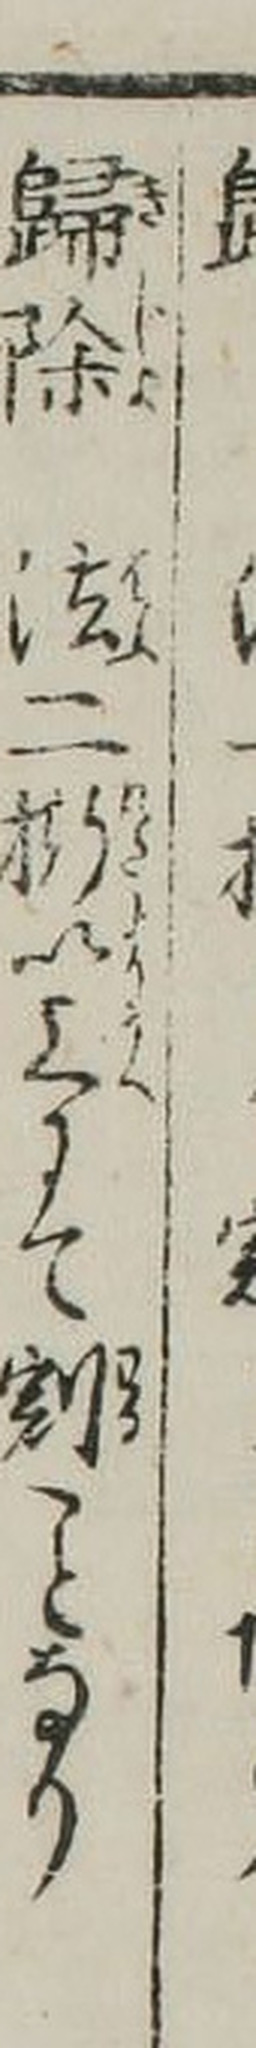帰除法二桁以上にて割ことなり
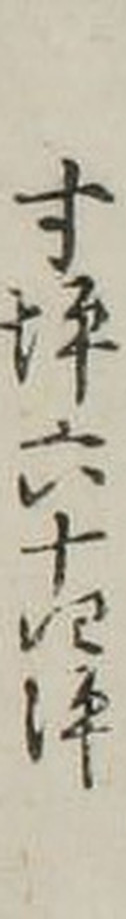寸坪六十四坪
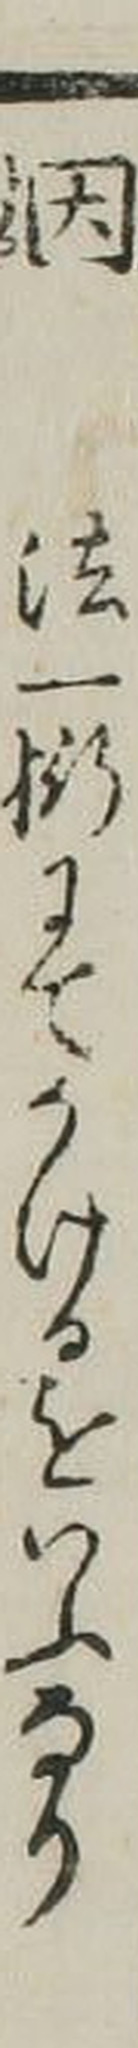因法一桁にてかけるをいふなり
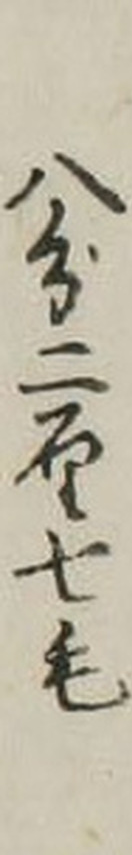八分二厘七毛
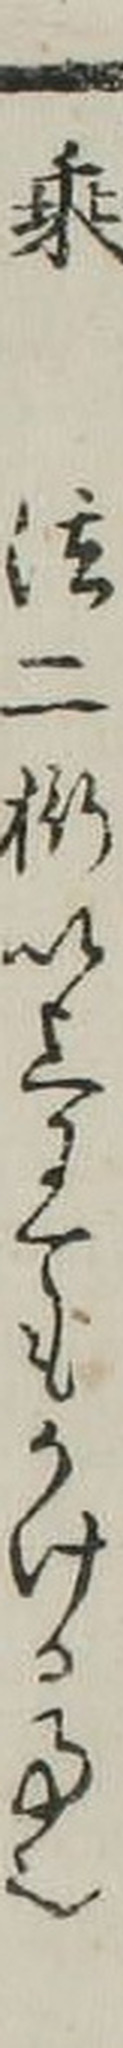乗法二桁以上にてもかける事也
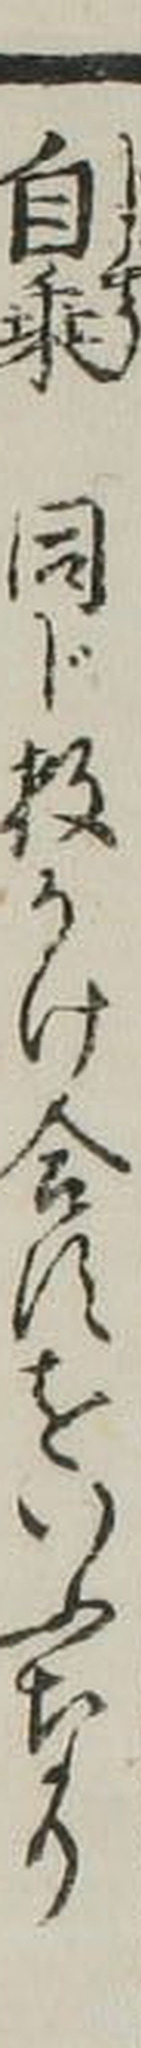自乗同じ数かけ合すをいふなり
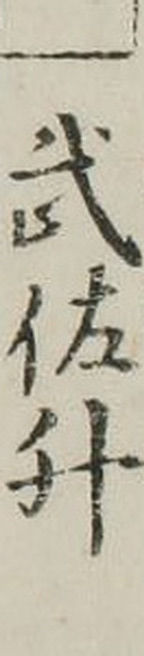武佐升
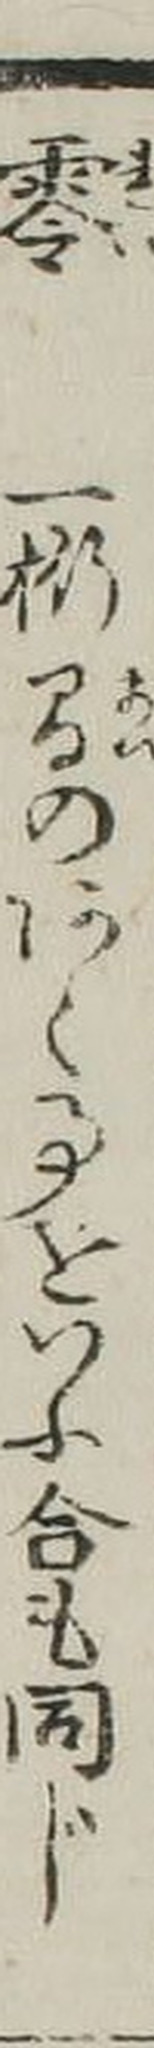零一桁間のあく事をいふ合も同じ
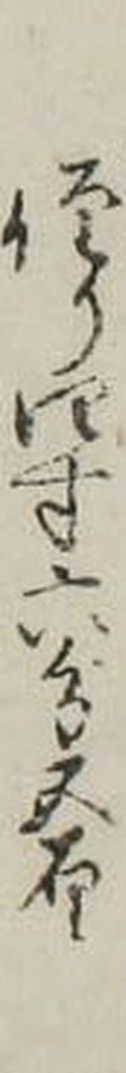径り四寸六分五厘
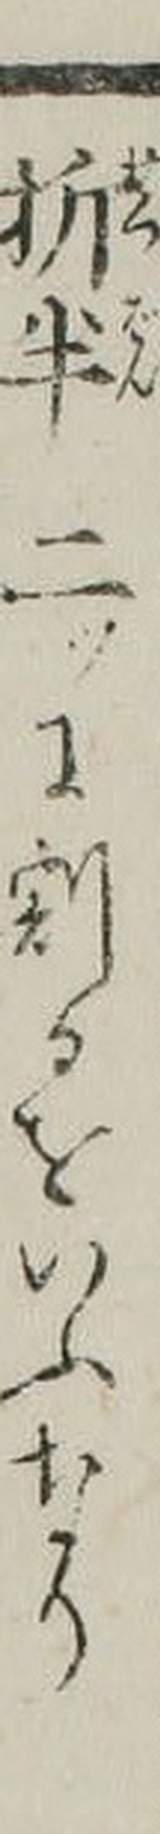折半二ッに割るをいふなり
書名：宝玉塵劫記
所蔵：東京学芸大学教育コンテンツアーカイブ
